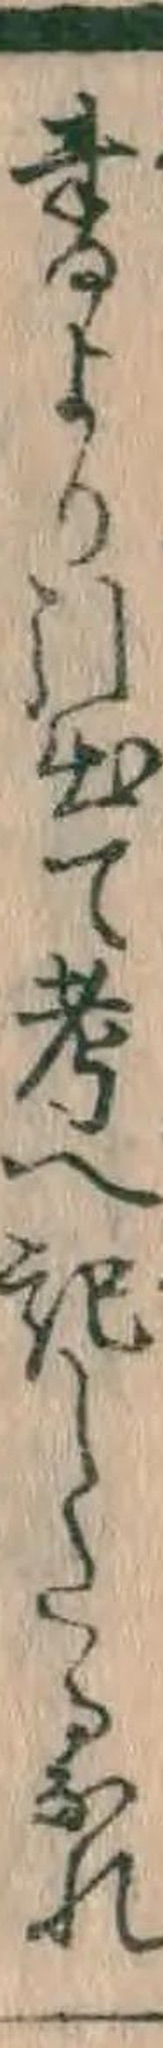書より引出て考へ記したるなれ
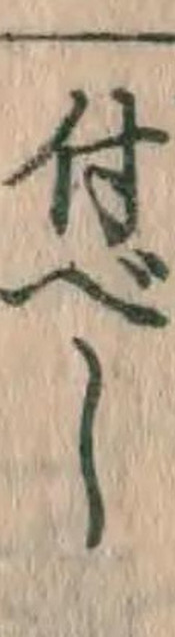付べし
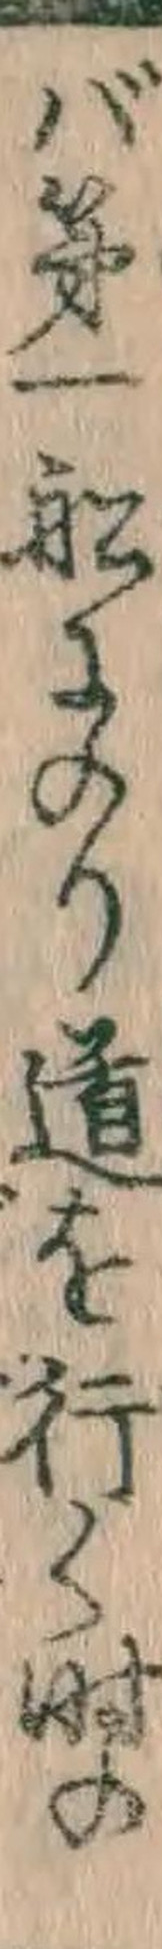ば第一船にのり道を行く時の
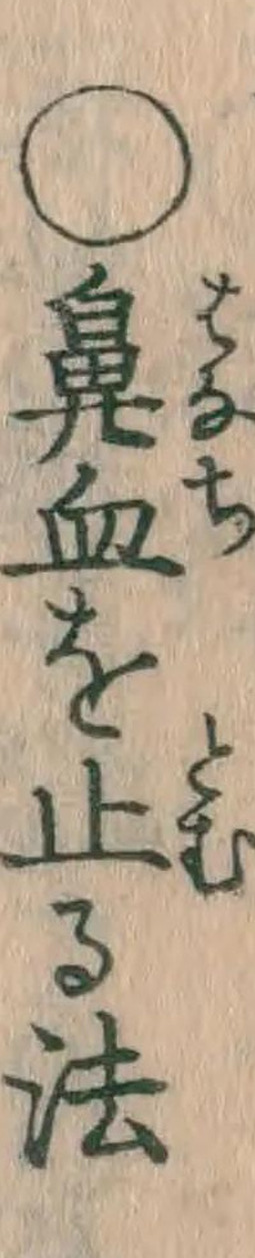○鼻血を止る法
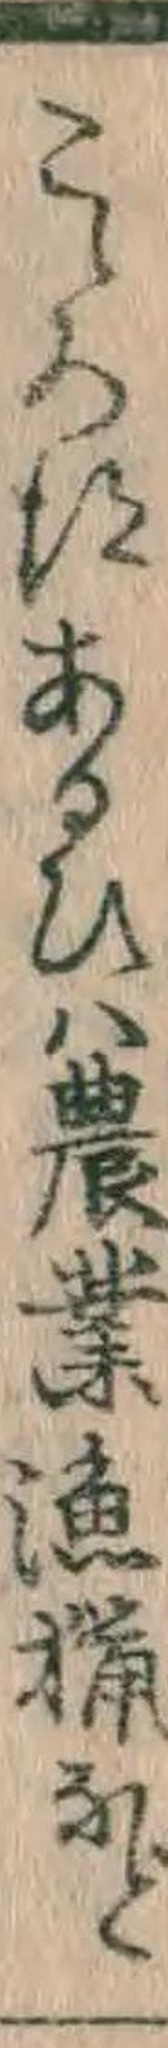こゝろ得あるひは農業漁猟など
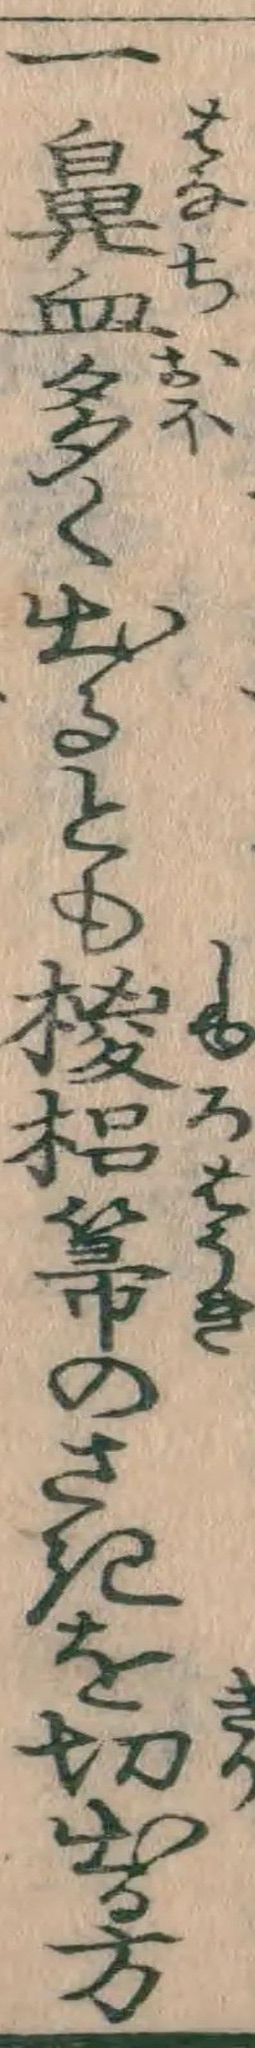一鼻血多く出るとも椶梠箒のさきを切出る方
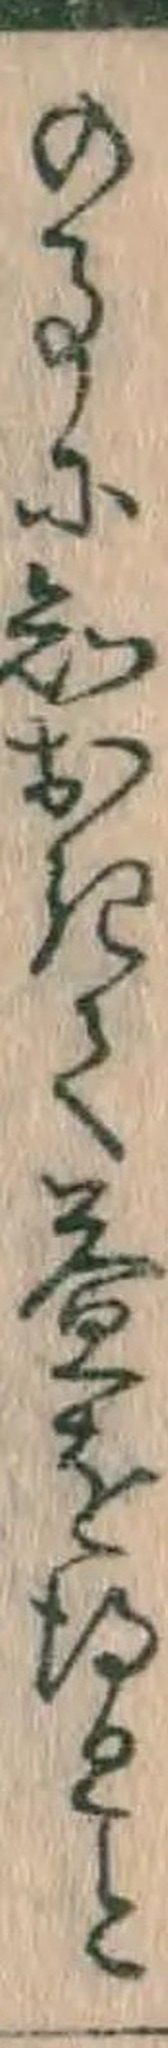の事に知おきて益を得ること
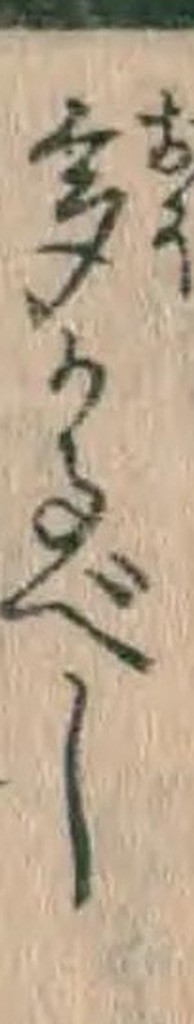多かるべし
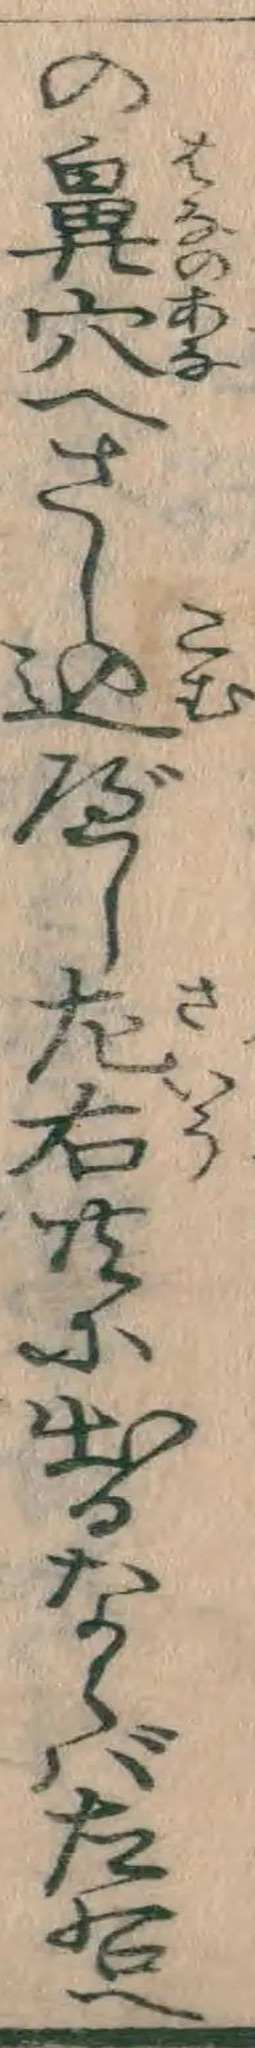の鼻穴へさし込べし左右共に出るならば左右へ
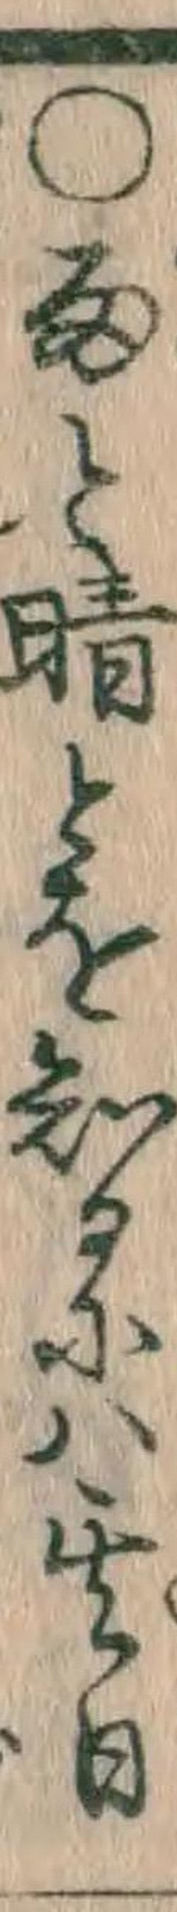○雨と晴とを知るには其日
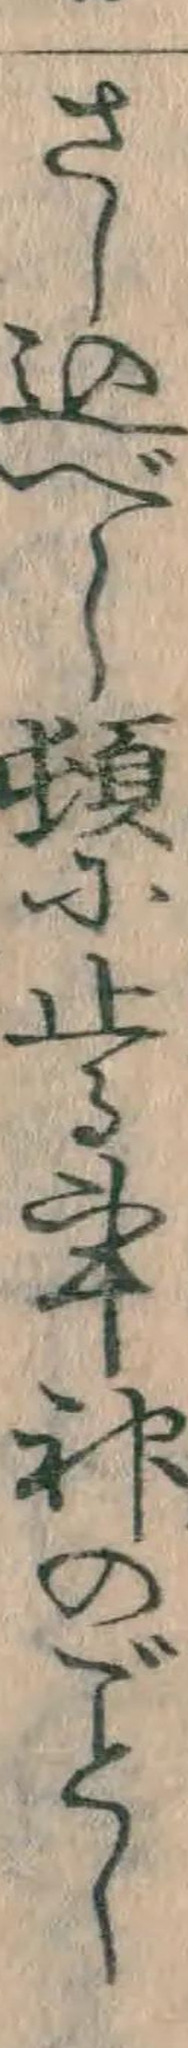さし込べし頓に止る事神のごとし
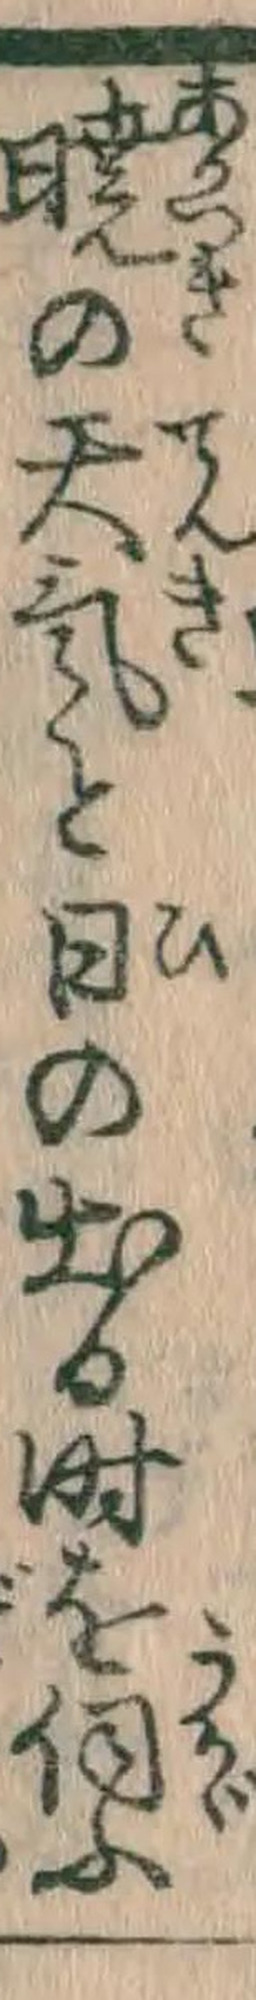暁の天気と日の出る時を伺ふ
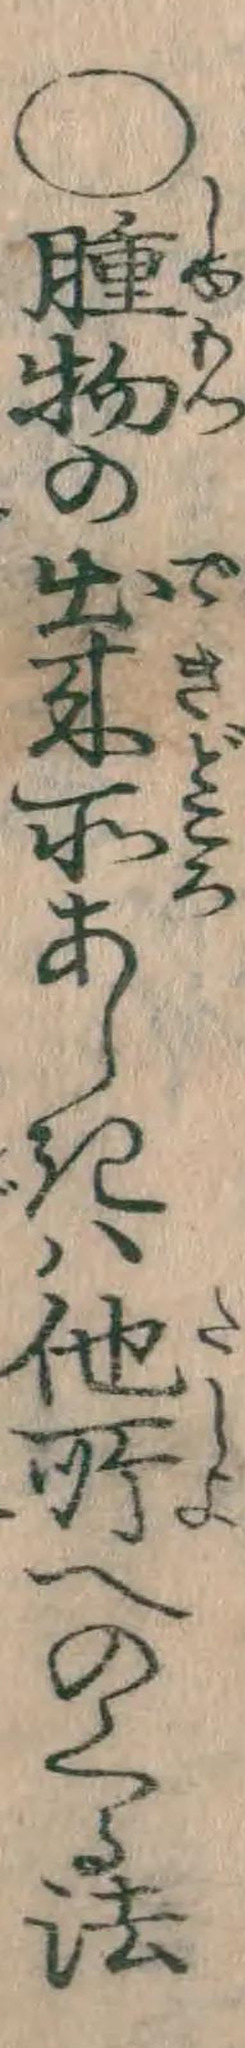○腫物の出来所あしきは他所へのくる法
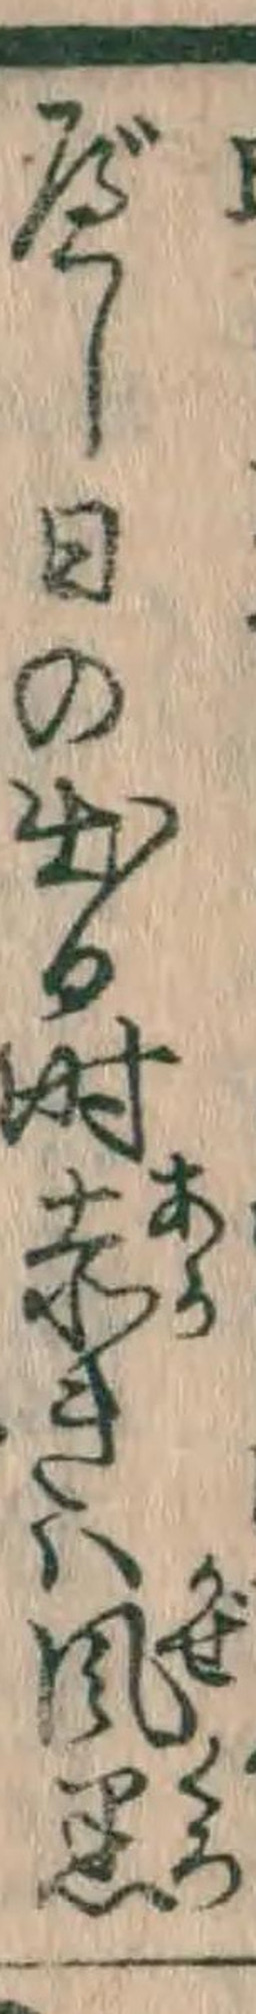べし日の出る時赤きは風黒
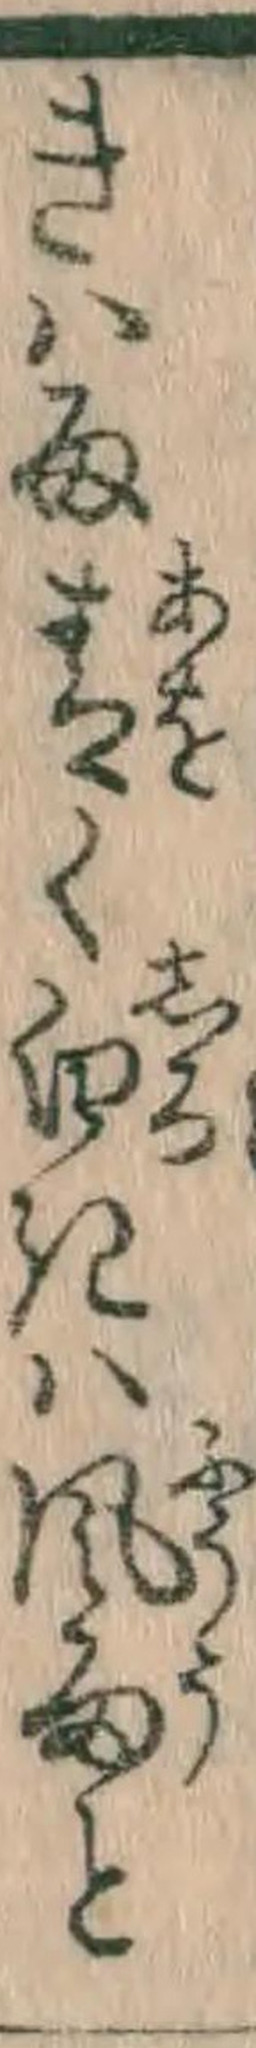きは雨青く白きは風雨と
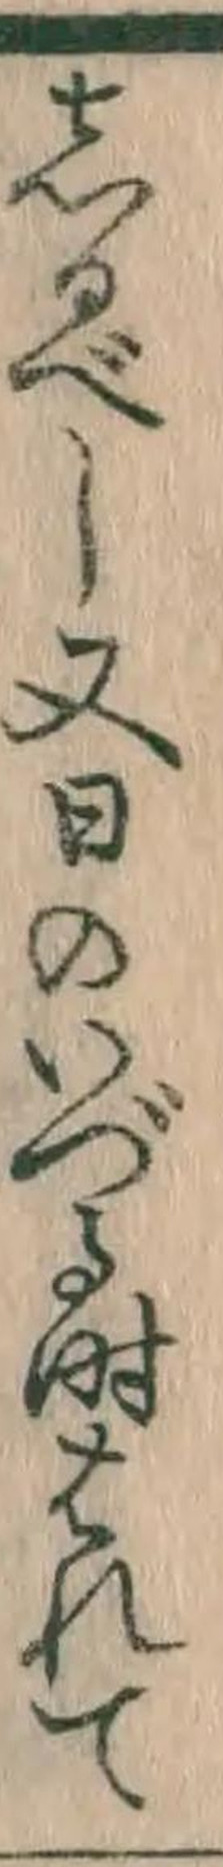しるべし又日のいづる時はれて
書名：広益秘事大全 3巻. [3]
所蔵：国立国会図書館 National Diet Library, JAPAN
